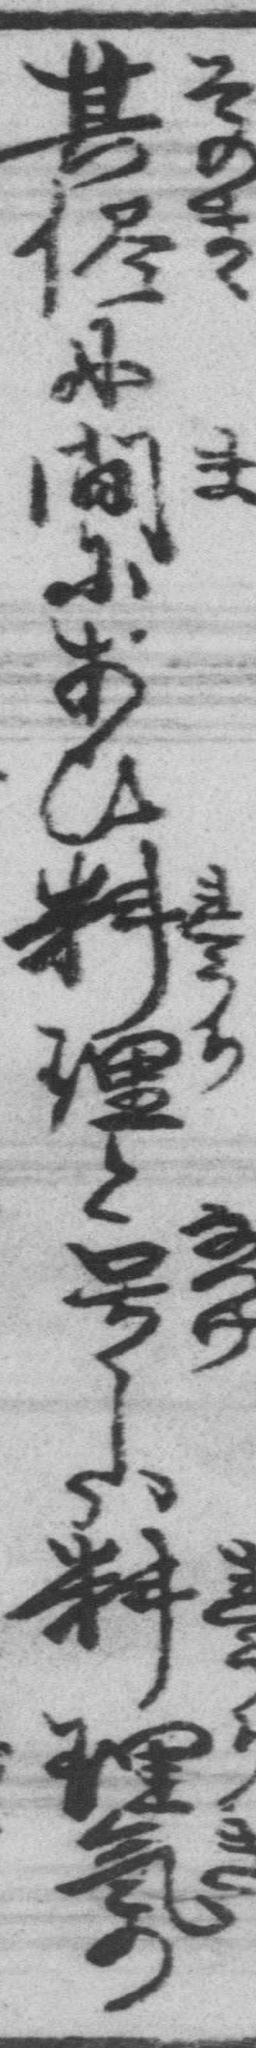其侭に間にあひ料理と号しは料理気の
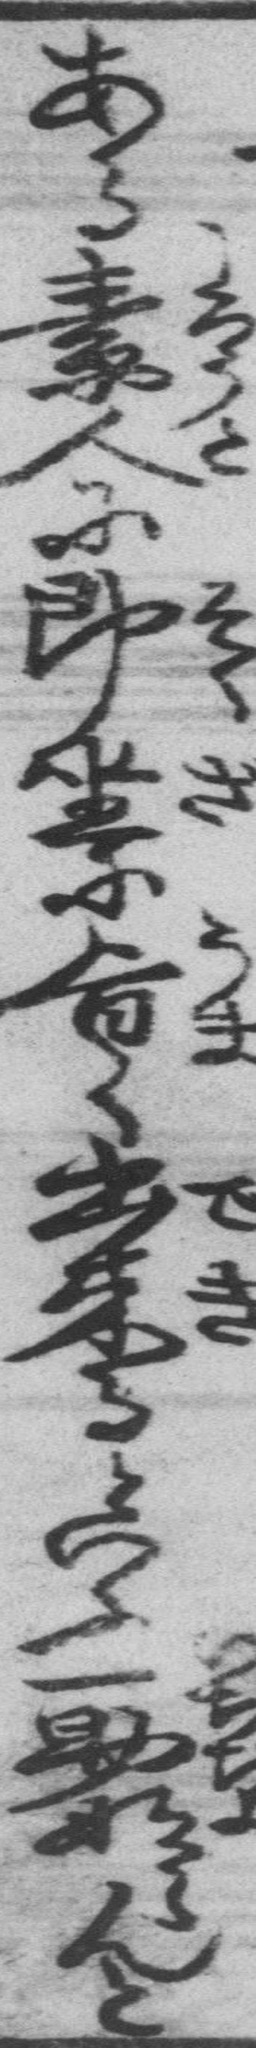ある素人に即坐に旨く出来るといふ一助ならんと
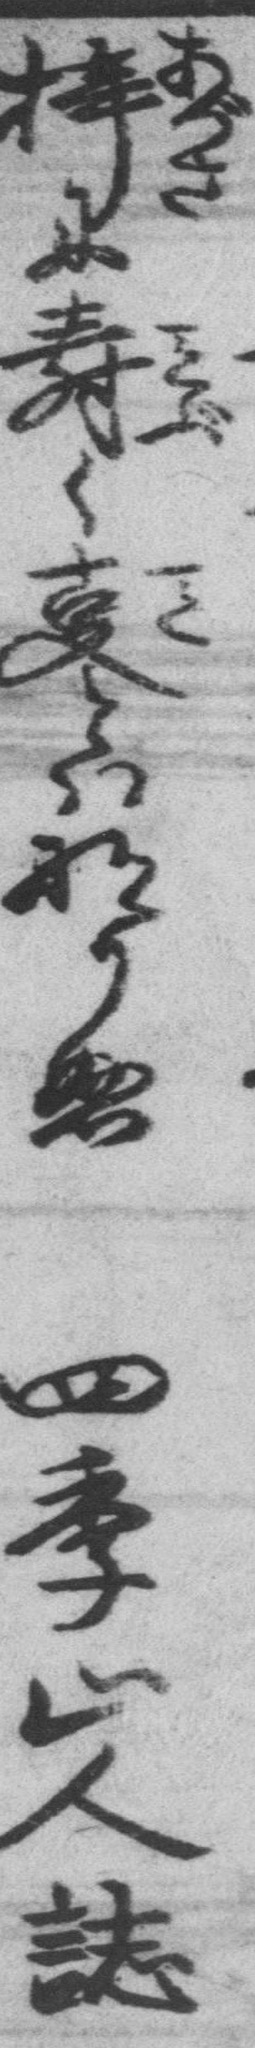梓に寿く事とはなりぬ四季山人誌

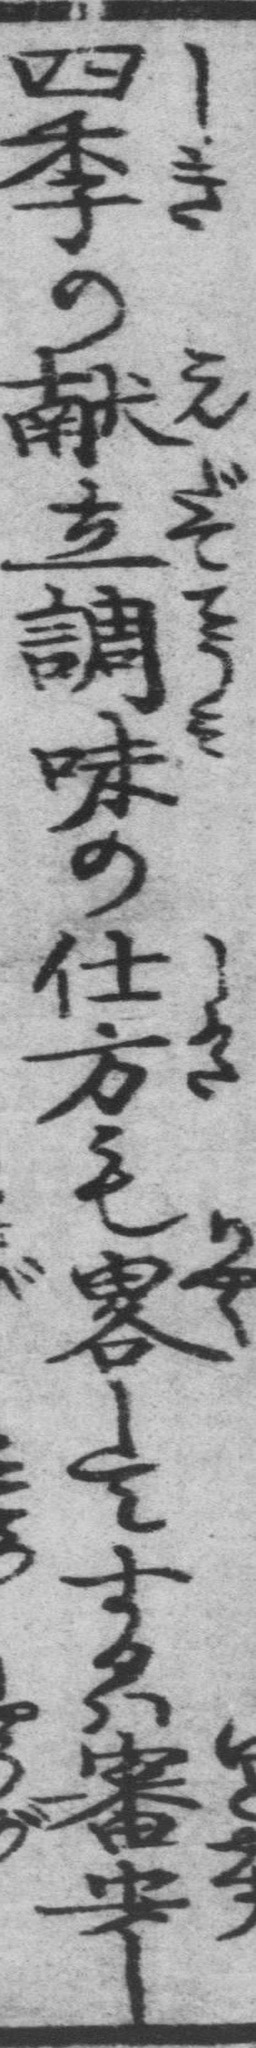四季の献立調味の仕方も略してするは審安し
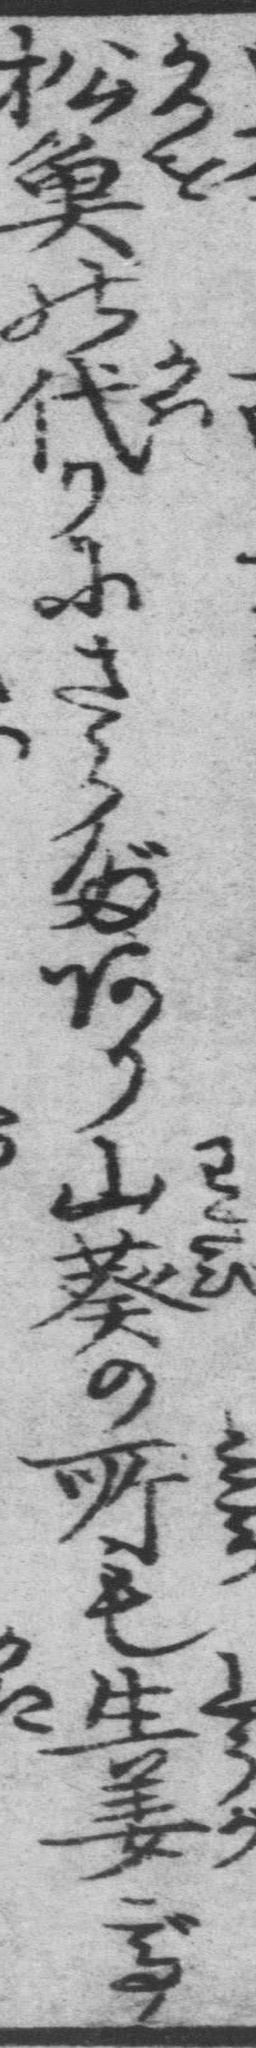松魚の代りにさうだあり山葵の所も生姜で
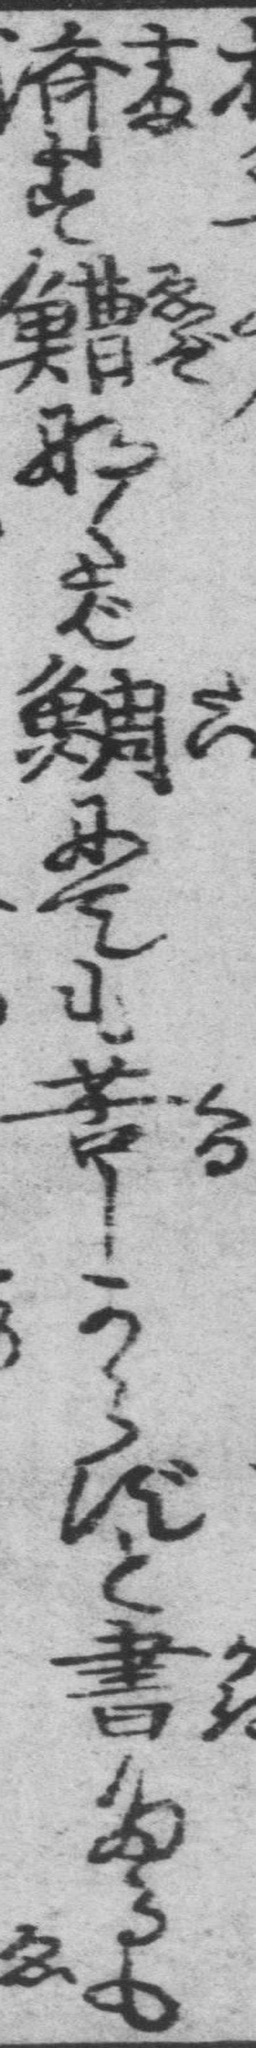済す鱛なくば鯛にても苦しからずと書たるも
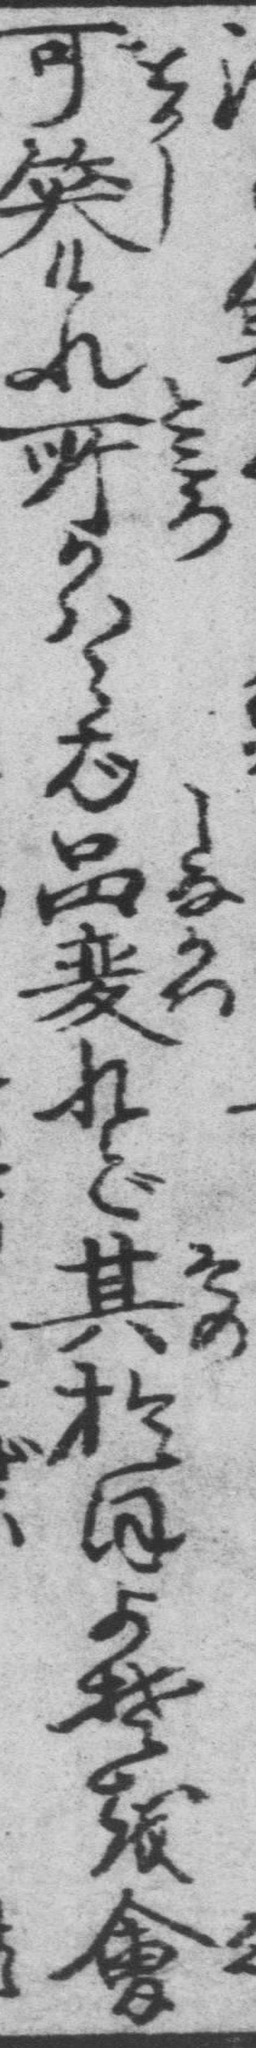可笑けれ所かはらば品変れど其おほよそを会
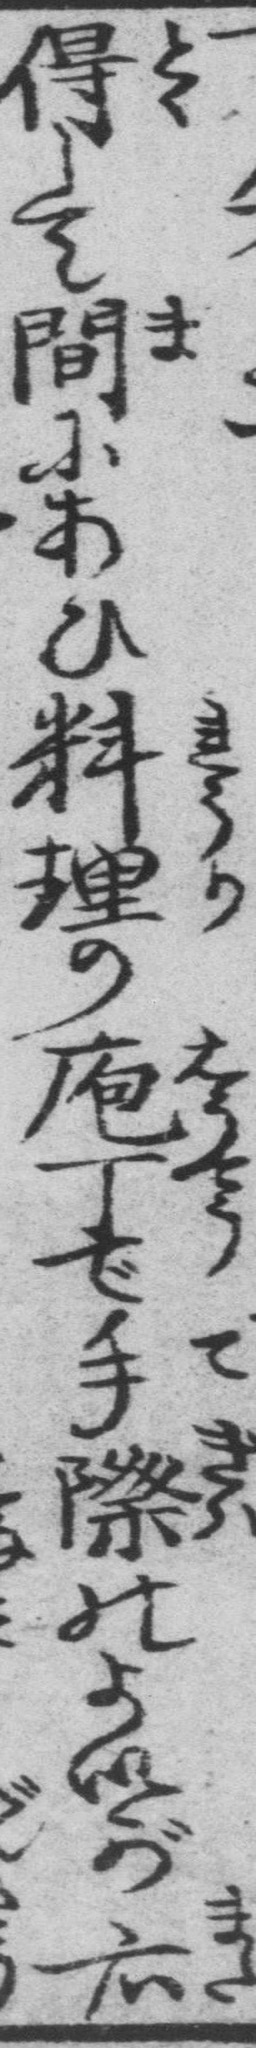得して間にあひ料理の包丁で手際のよいが亦
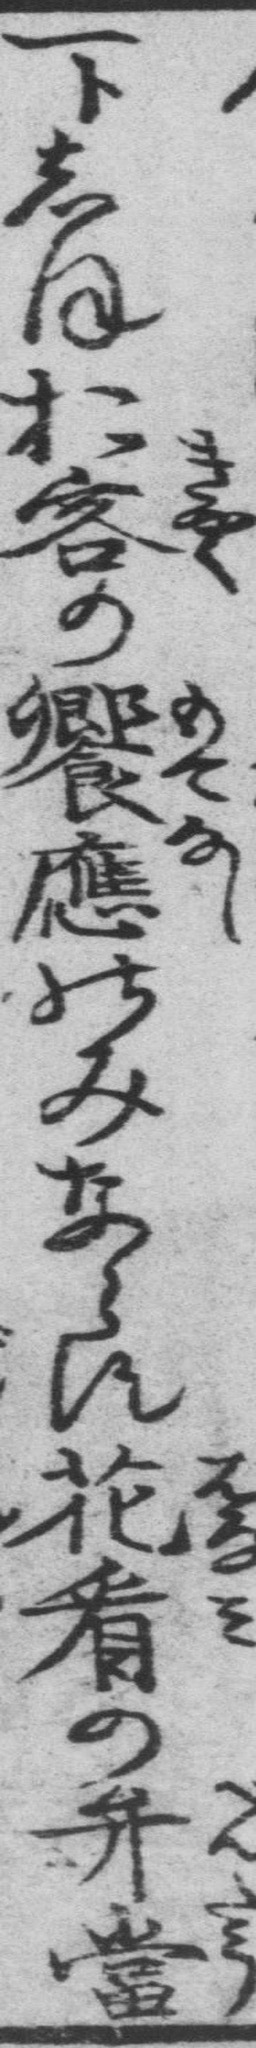一トしほお客の饗応のみならす花看の弁当
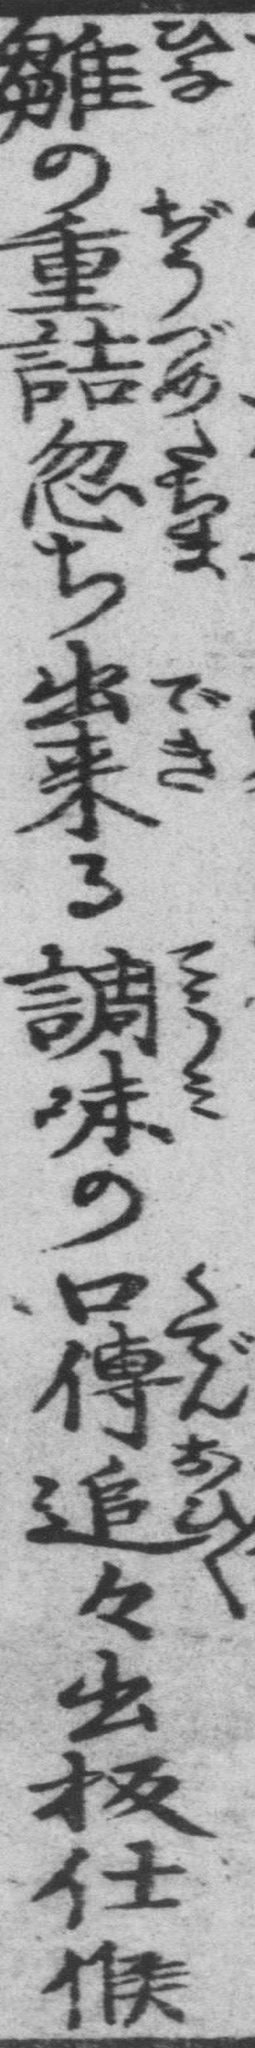雛の重詰忽ち出来る調味の口伝追々出板仕候
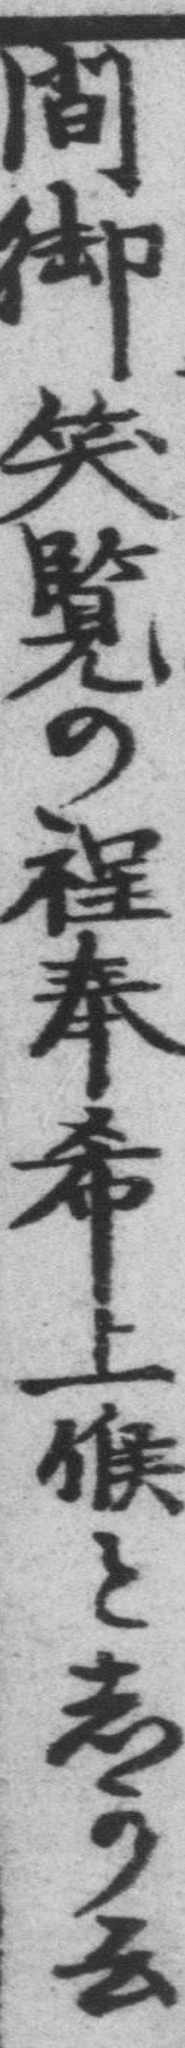間御笑覧の程奉希上候としか云
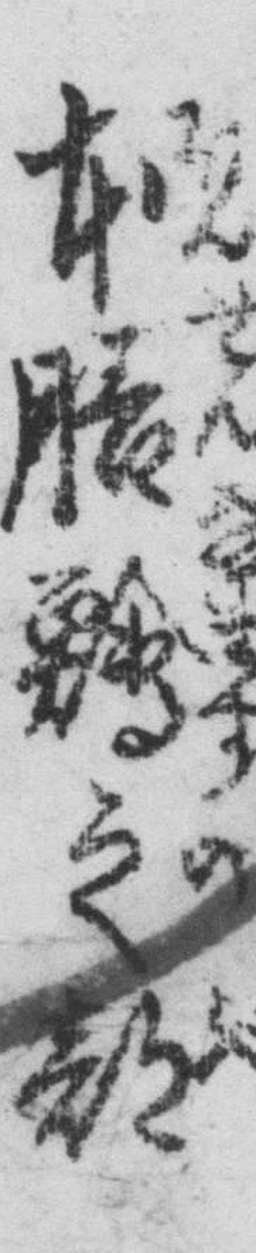本膳鱠之部

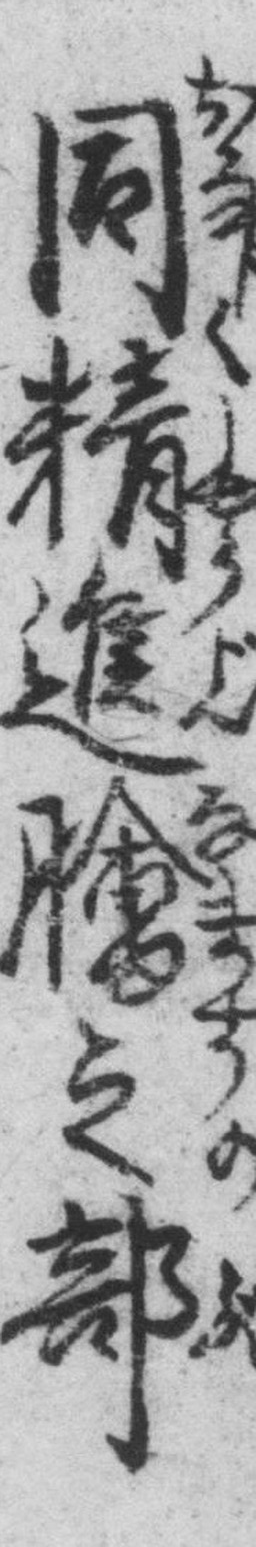同精進鱠之部
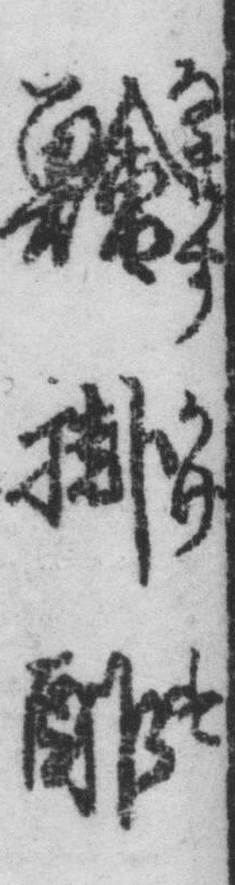鱠掛酢
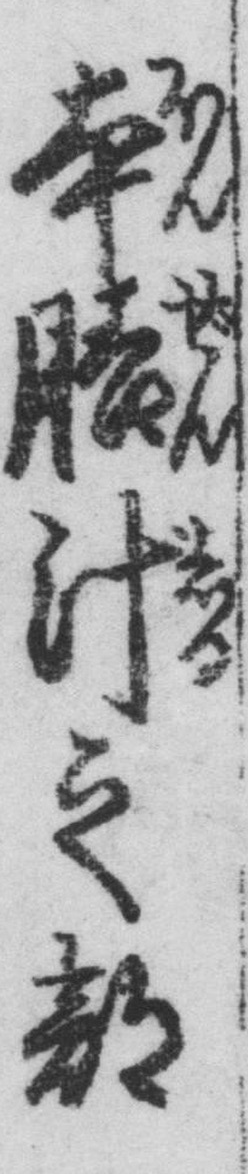本膳汁之部

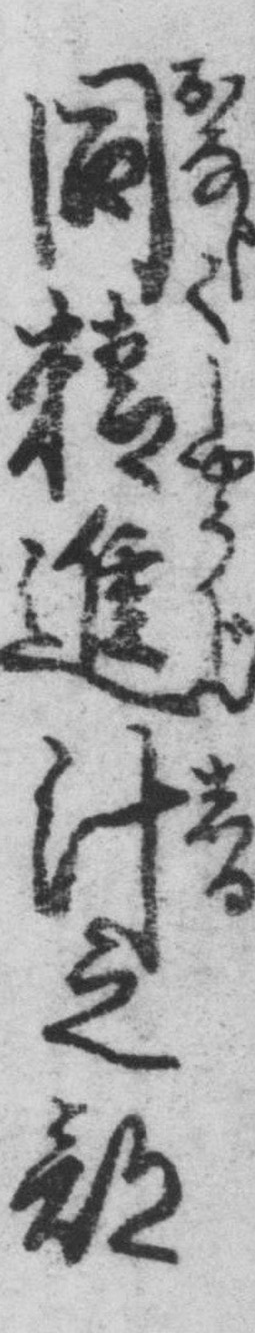同精進汁之部
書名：即席庖丁
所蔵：大阪府立大学学術情報センター 国文学研究資料館
